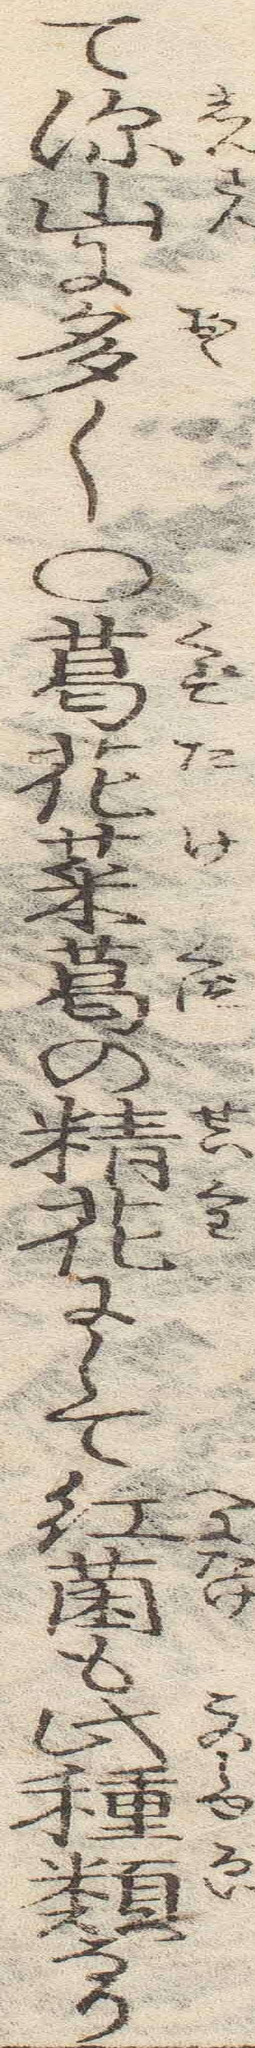て深山に多し○葛花菜葛の精花にして紅蕈も此種類なり
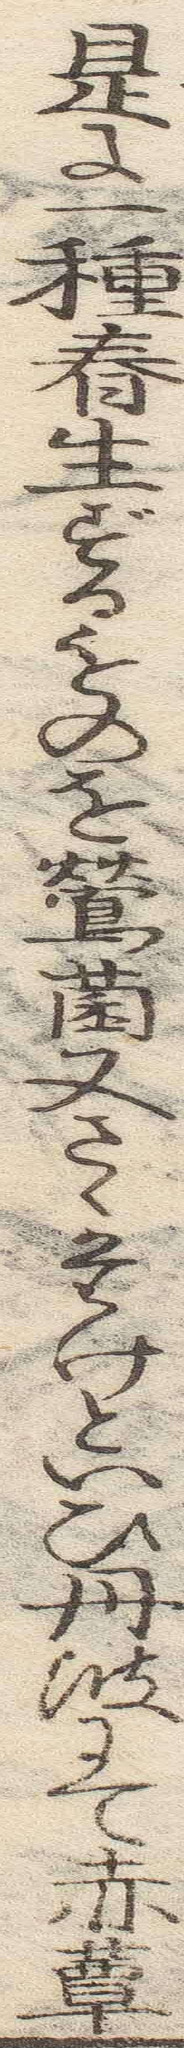是に一種春生ずるものを鶯菌又さゝたけといひ丹波にて赤蕈
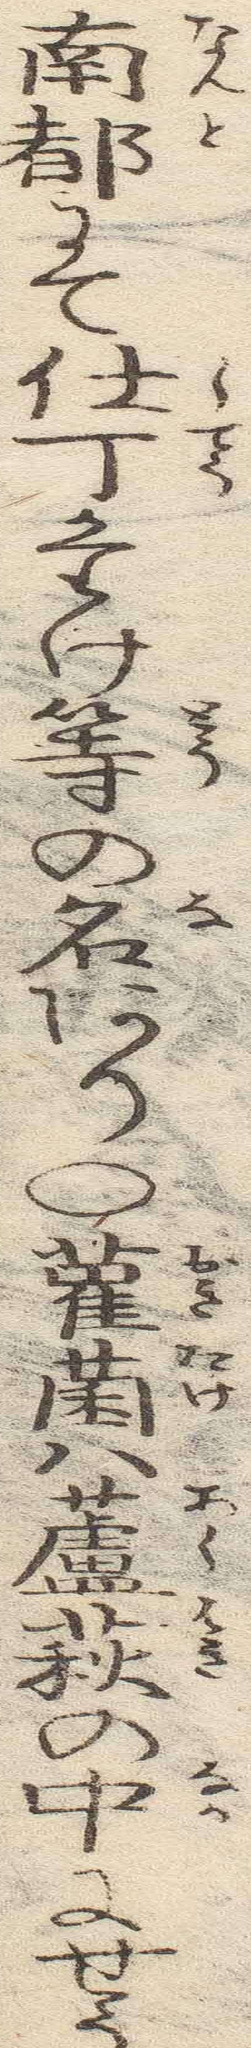南都にて仕丁たけ等の名あり○雚菌は蘆萩の中にせう
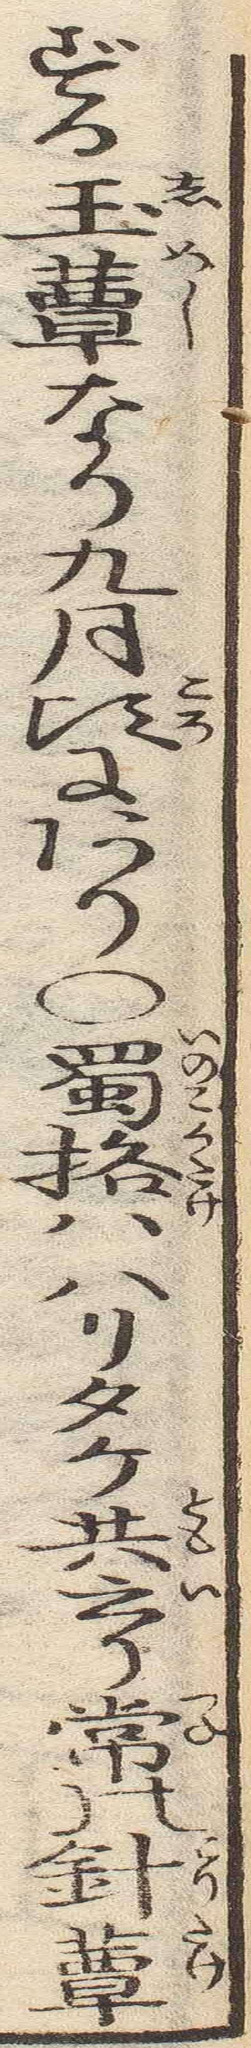ずる玉蕈なり九月頃にあり○蜀挌はハリタケ共云う常の針蕈
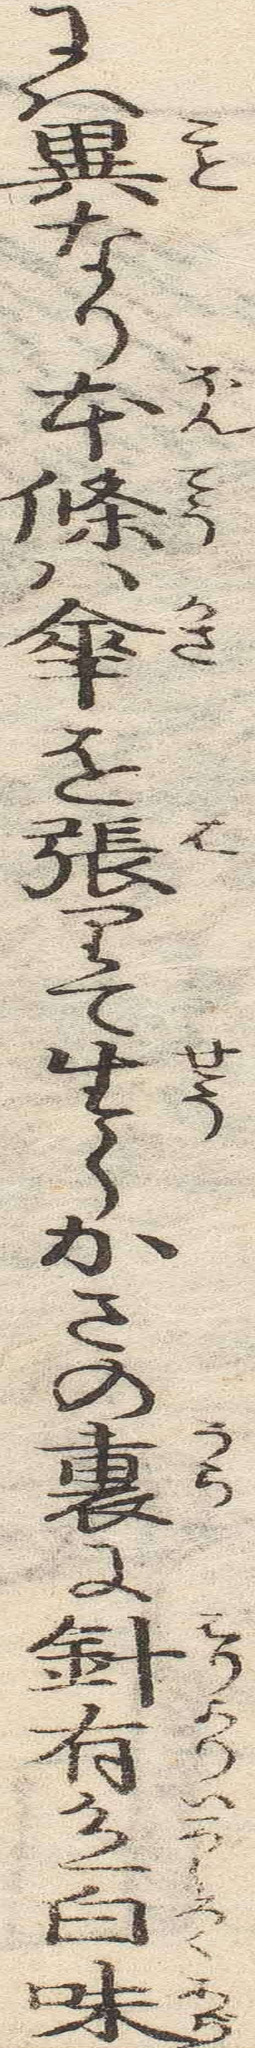には異なり本條は傘を張りて生しかさの裏に針有色白味
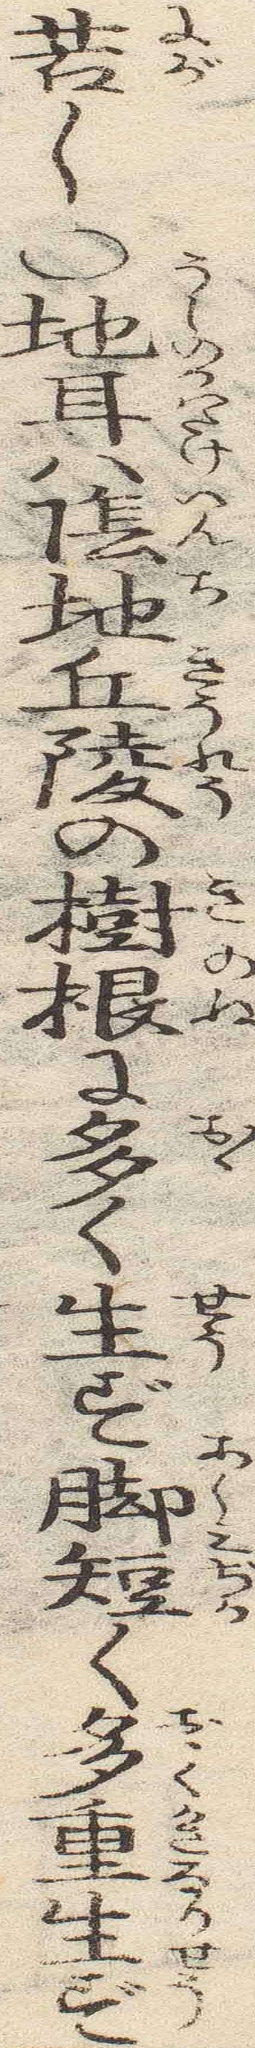苦し○地耳は陰地丘陵の樹根に多く生ず脚短く多重生ず
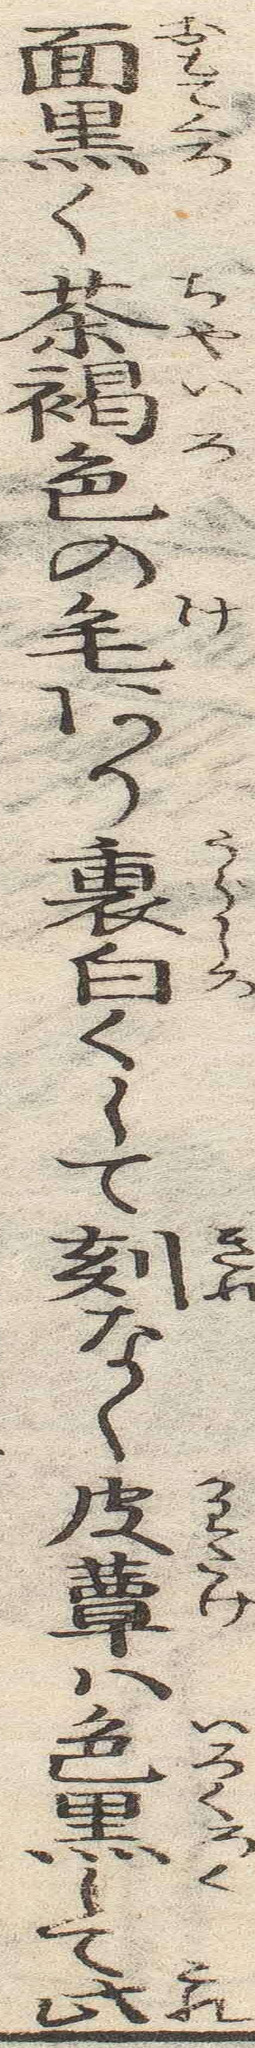面黒く茶褐色の毛あり裏白くして刻なし皮蕈は色黒して此
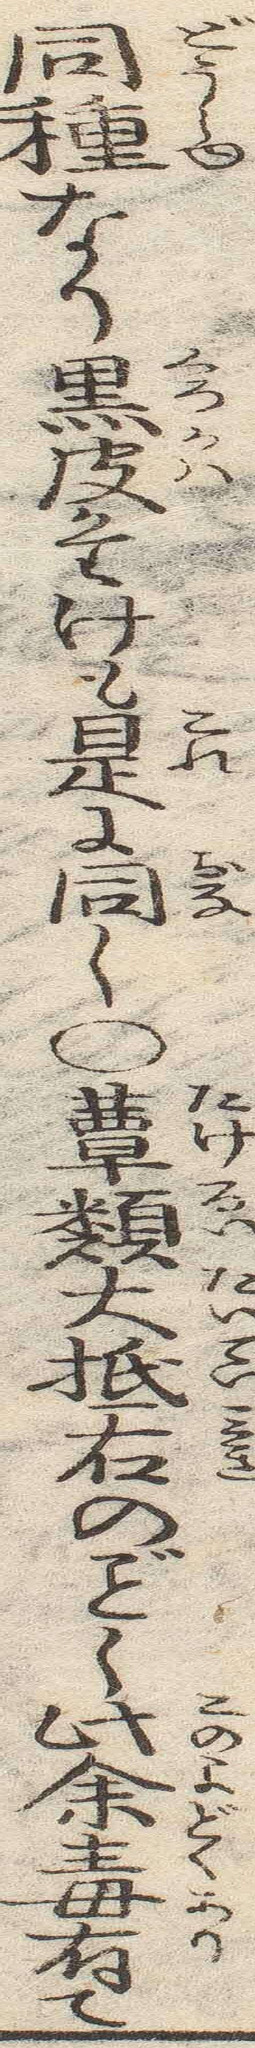同種なり黒皮たけも是に同し○蕈類大抵右のごとし此余毒有て
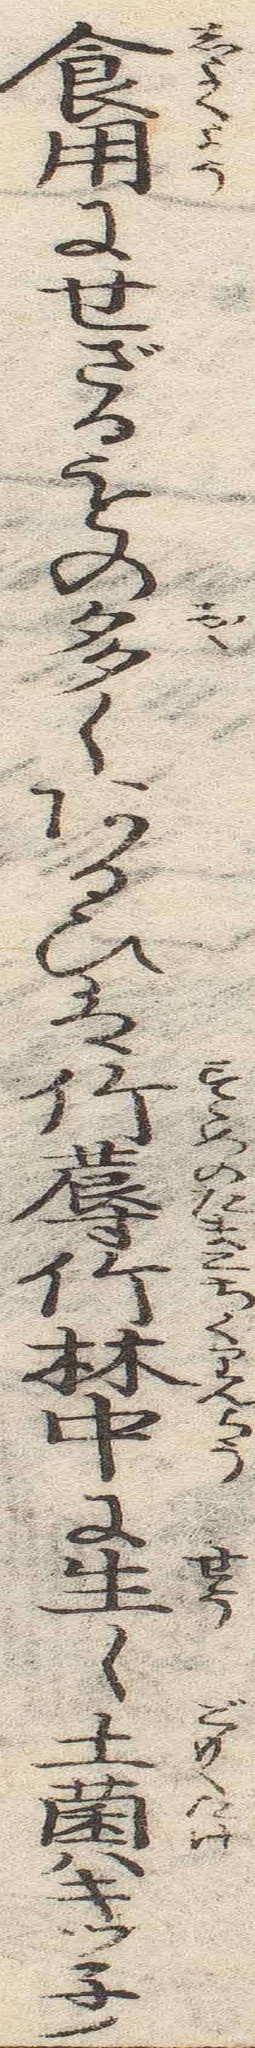食用にせざるもの多しあるひは竹蓐竹林中に生し土菌はキツネノ
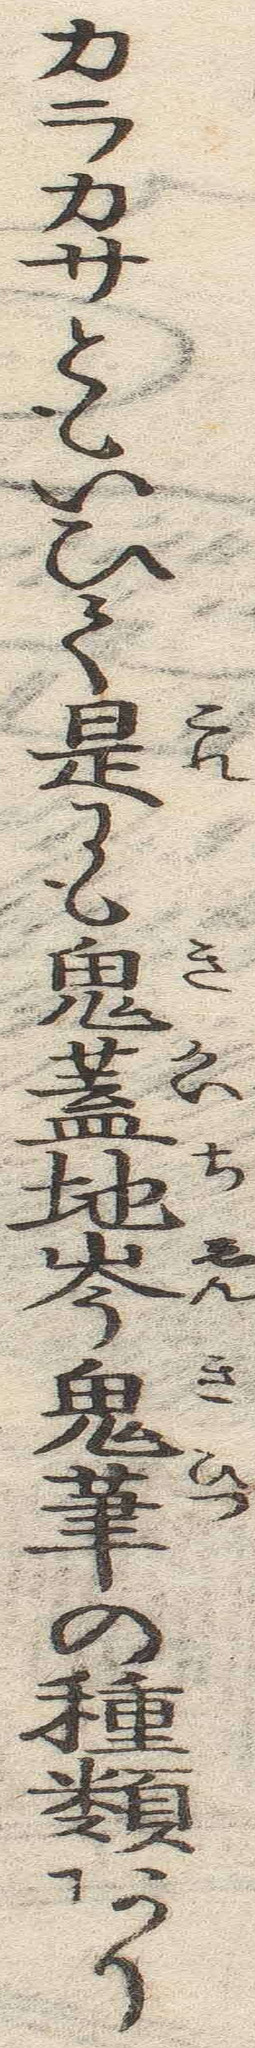カラカサともいひて是にも鬼蓋地岑鬼茟の種類あり
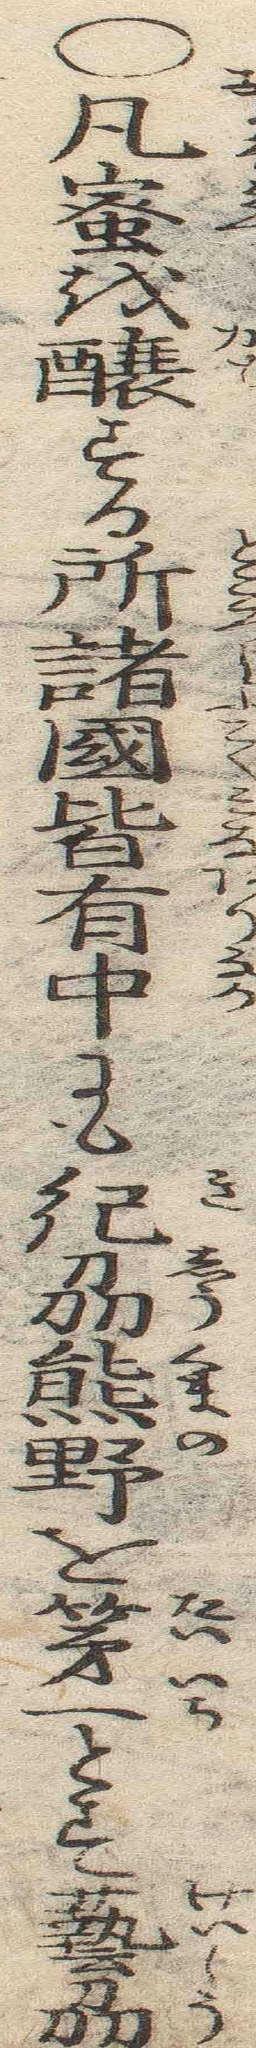○凡蜜を醸する所諸国皆有中にも紀州熊野を第一とす芸州
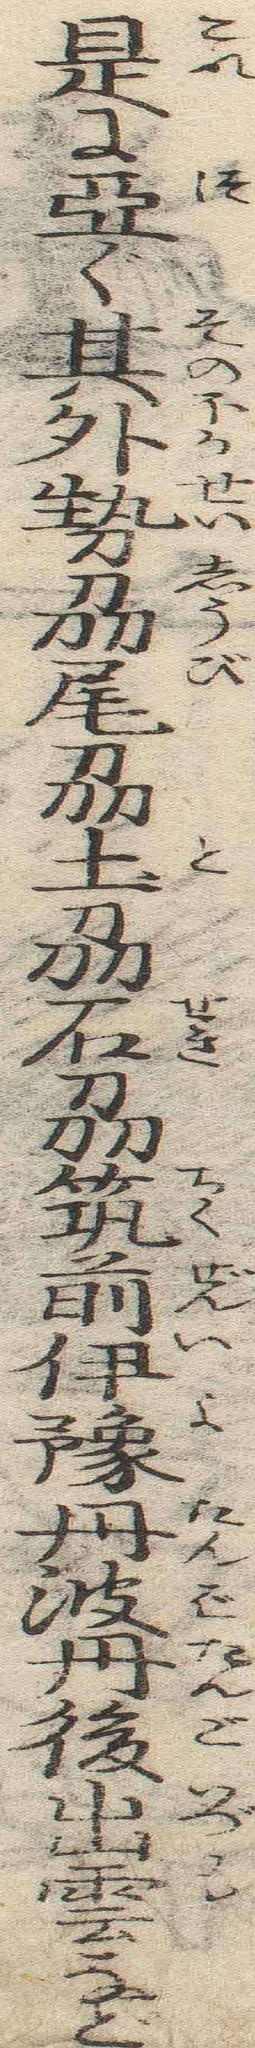是に亜ぐ其外勢州尾州土州石州筑前伊予丹波丹後出雲など
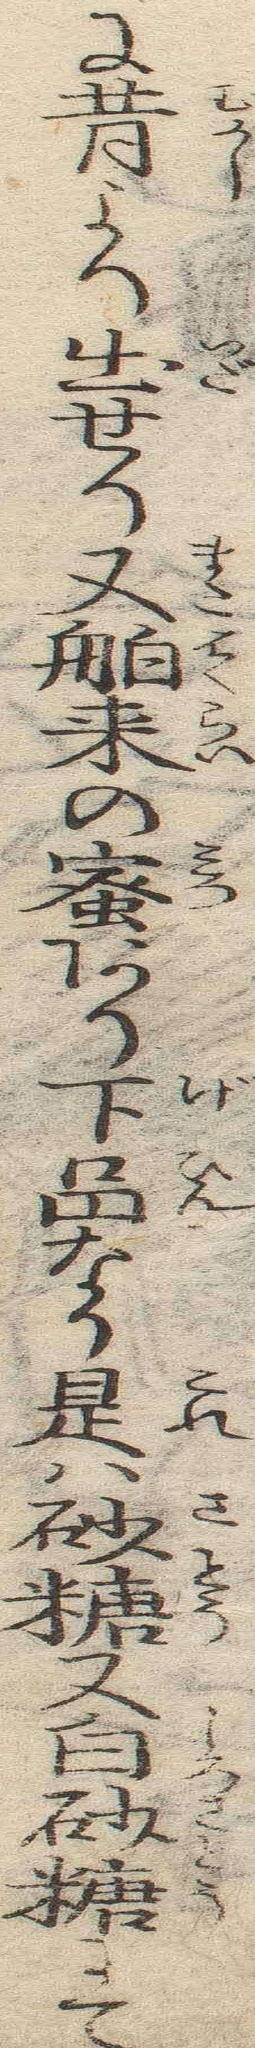に昔より出せり又舶来の蜜あり下品なり是は砂糖又白砂糖にて
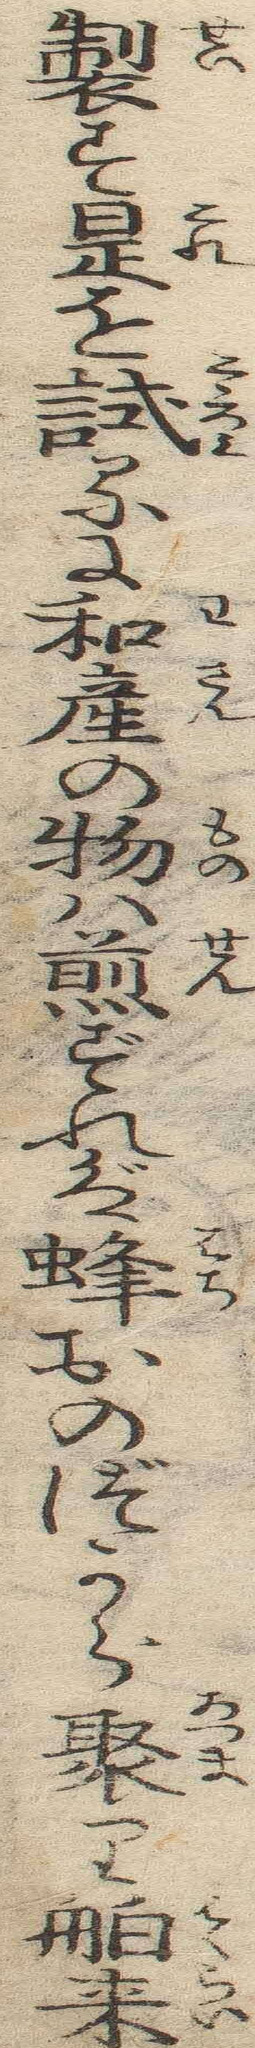製す是を試るに和産の物は煎ずれば蜂おのづから聚り舶来

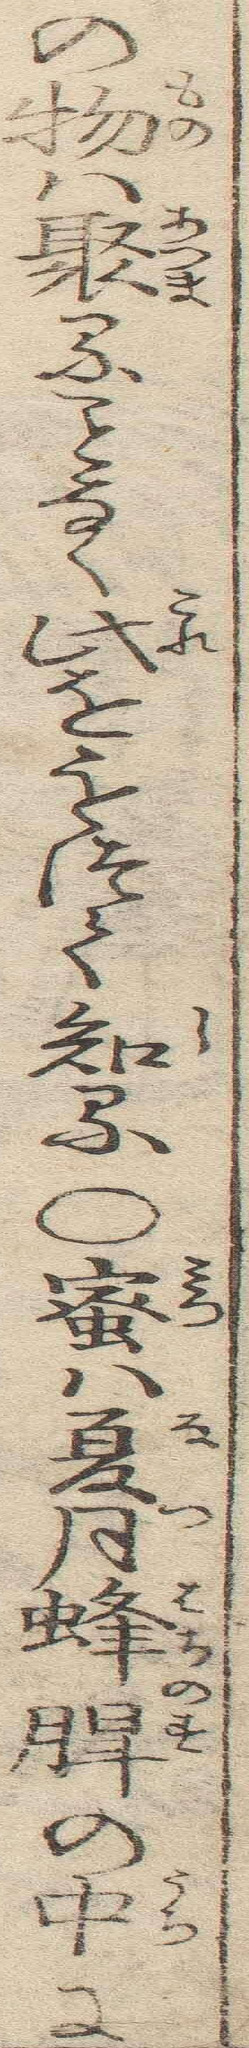の物は聚ることなく此をもつて知る○蜜は夏月蜂脾の中に
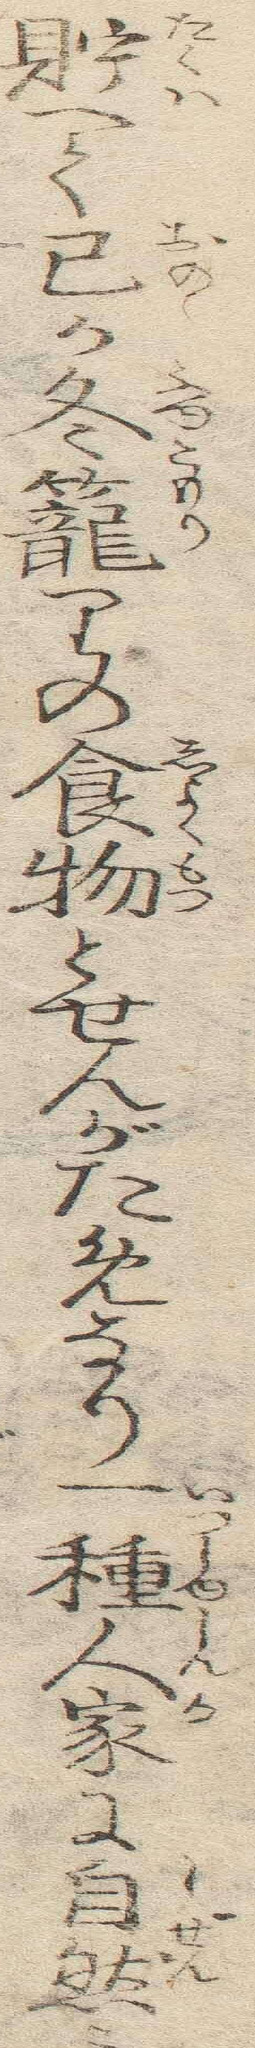貯へて己々冬籠りの食物とせんがためなり一種人家に自然に
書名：日本山海名産図会
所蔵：東京学芸大学附属図書館 国文学研究資料館
